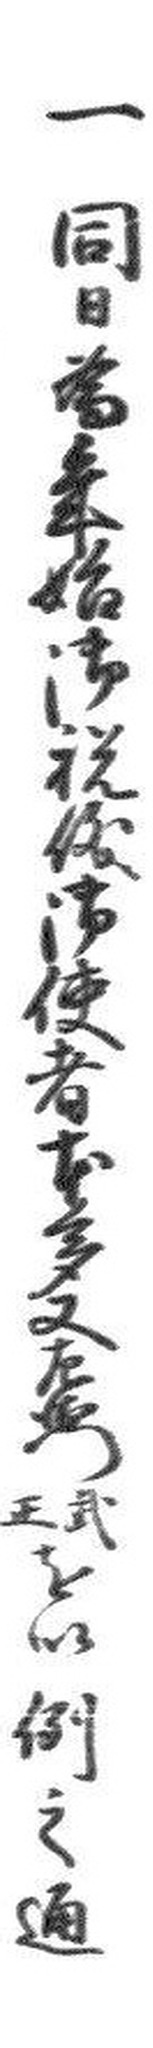一同日為年始御祝儀御使者本多又左衛門武正を以例之通
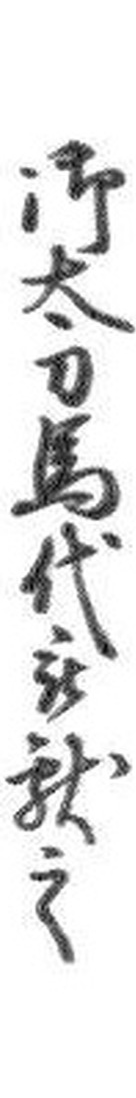御太刀馬代被献之
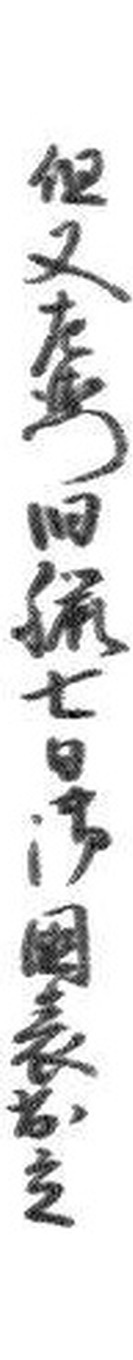但又左衛門旧臘七日御国表出立
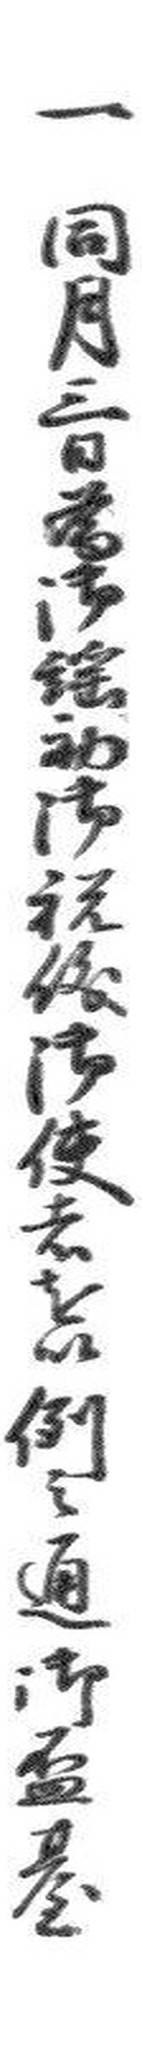一同月三日為御謡初御祝儀御使者を以例之通御盃台
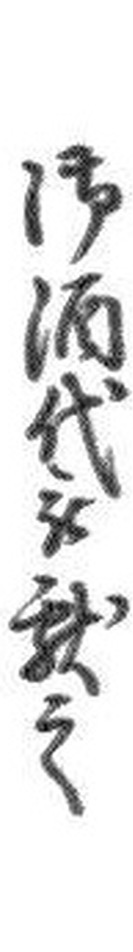御酒代被献之

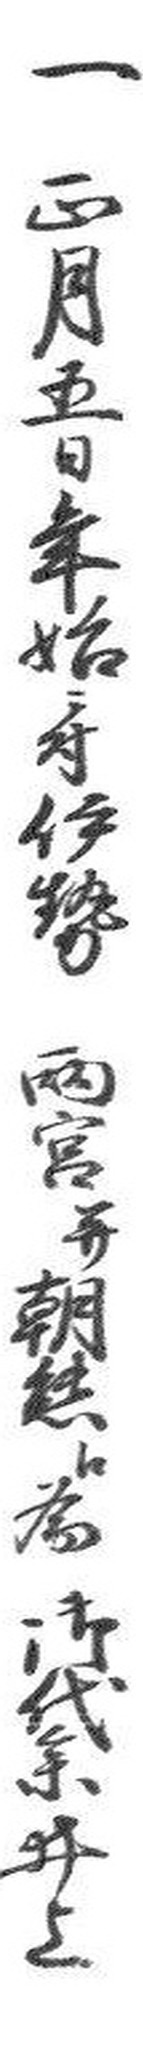一正月五日年始ニ付伊勢両宮并朝熊江為御代参井上
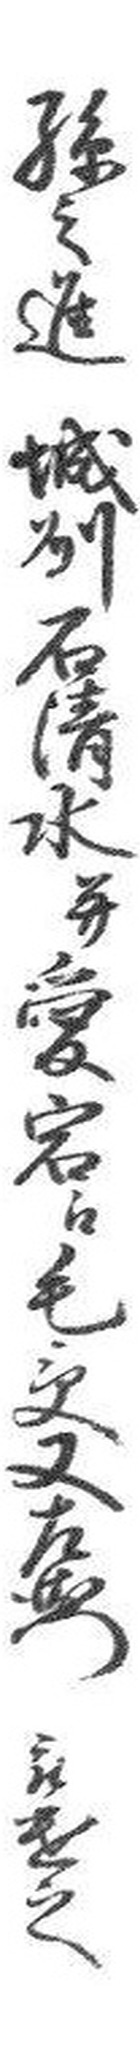孫之進城州石清水并愛宕江毛受又左衛門被遣之
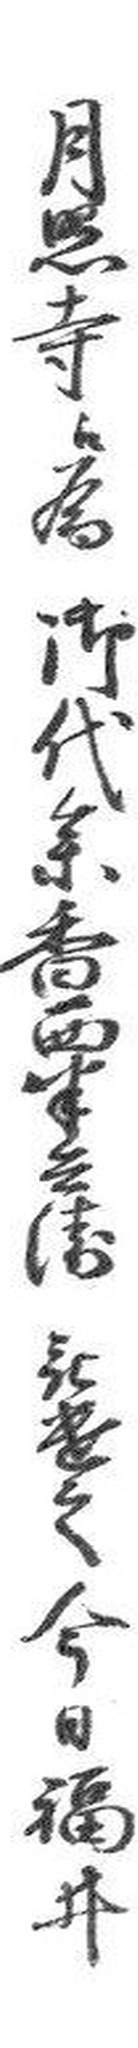月照寺江為御代参香西半兵衛被遣之今日福井
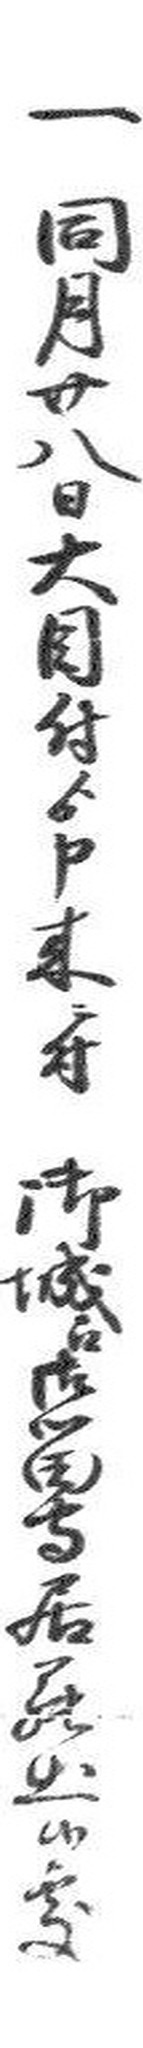一同月廿八日大目付ゟ申来ニ付御城江御留守居罷出候処
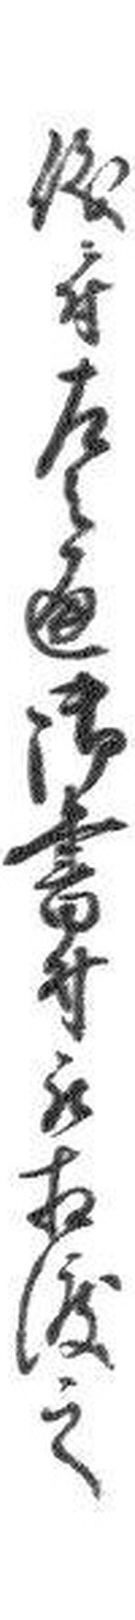儀ニ付左之通御書付被相渡之
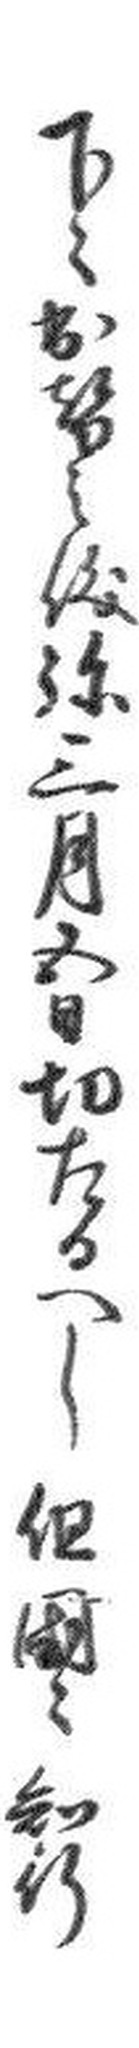下々出替之儀弥三月五日切たるへし但国々知行
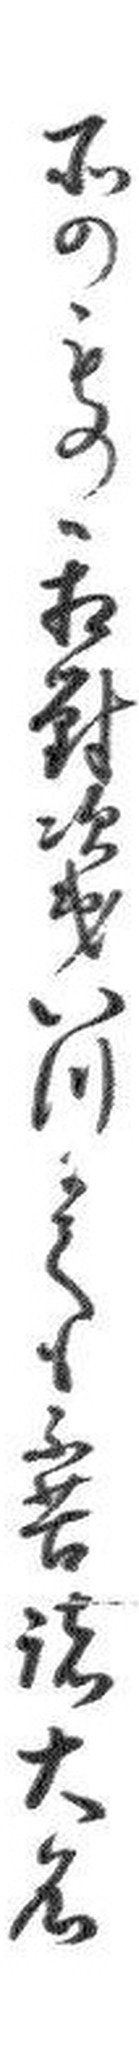所のものゝ相対次第いつにても不苦諸大名
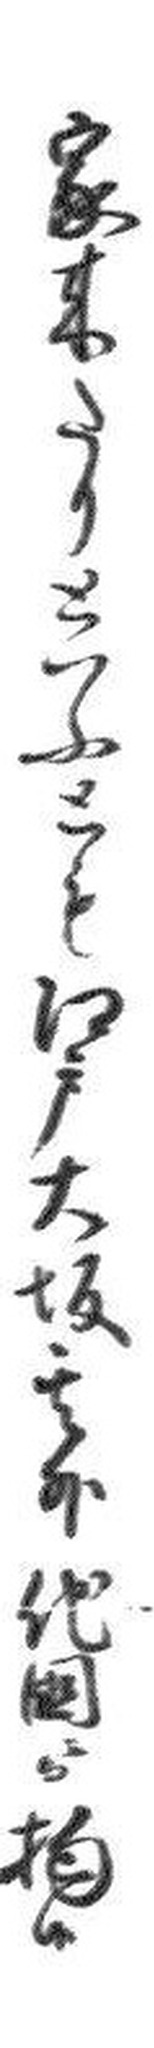家来たりといふとも江戸大坂其外他国ニ而抱候
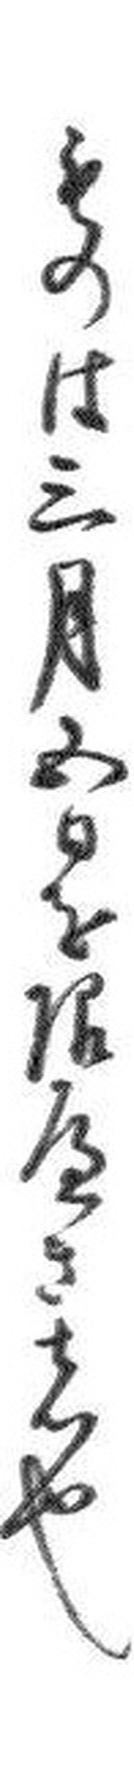ものは三月五日を限へき者也
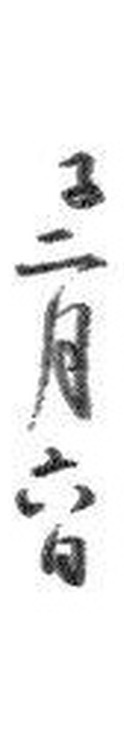子二月六日
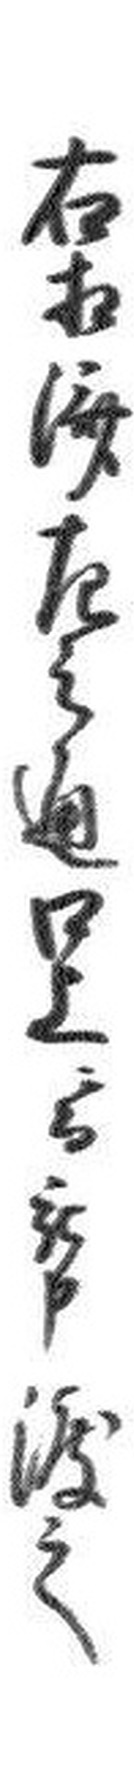右相済左之通口上ニ而被申渡之
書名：家譜 八 光通公 従寛文十年到同十二年
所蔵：福井県文書館 Fukui Prefectural Archives
